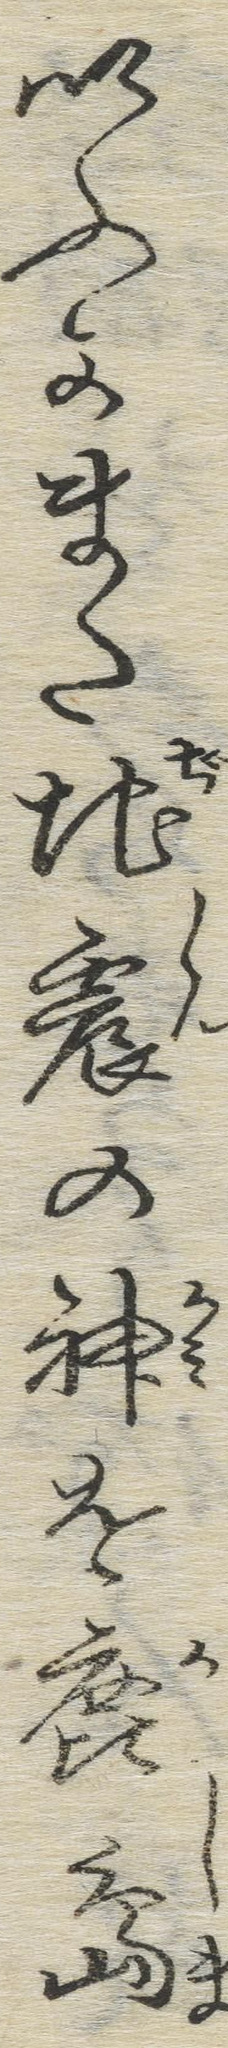いふかまた地震の神を鹿島
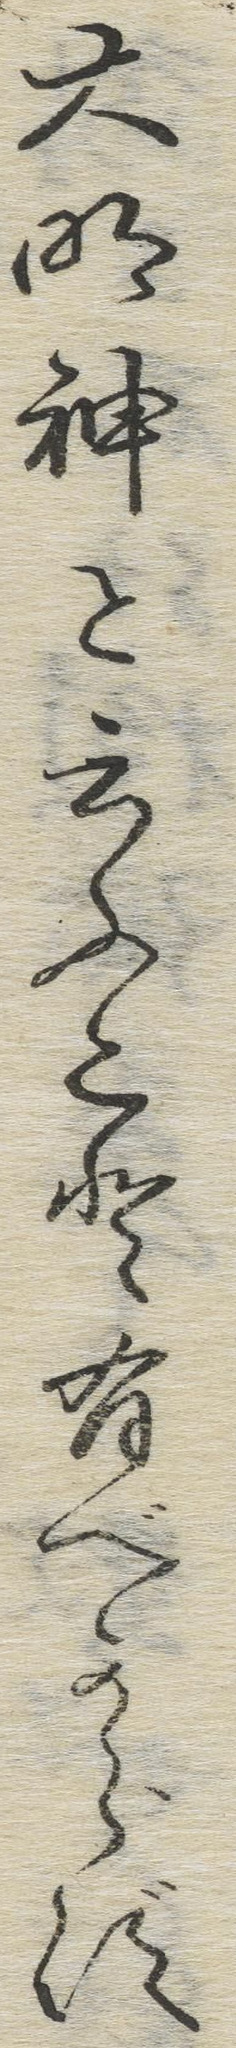大明神と云ふこと有べからず
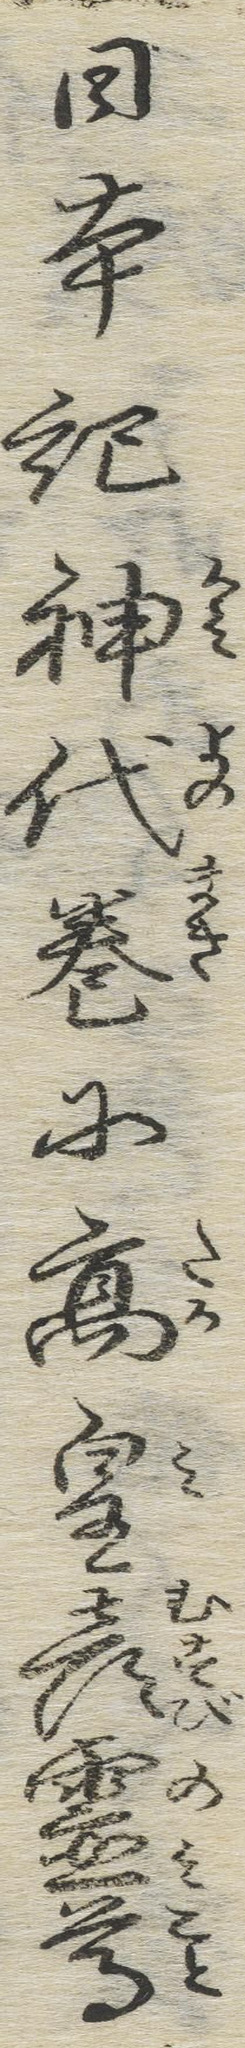日本紀神代巻に高皇産霊尊
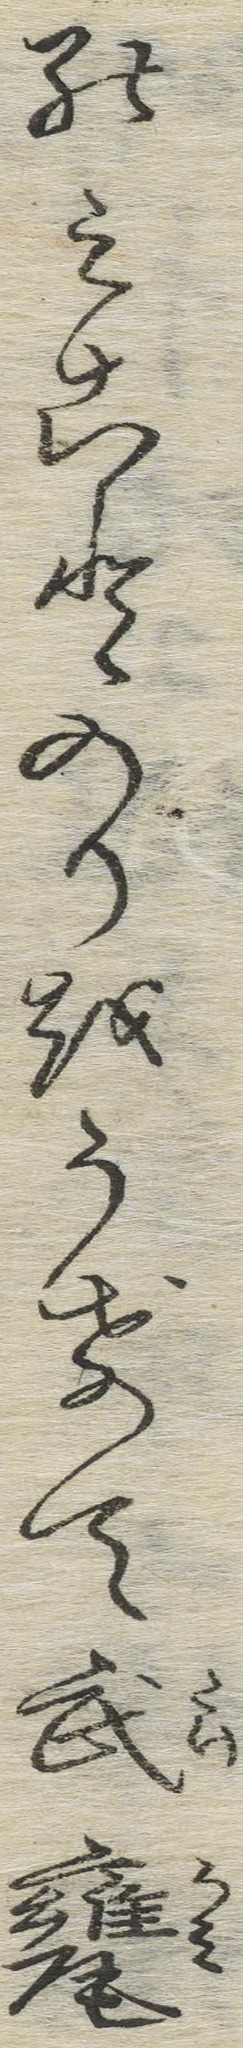のみことのりをうけて武甕
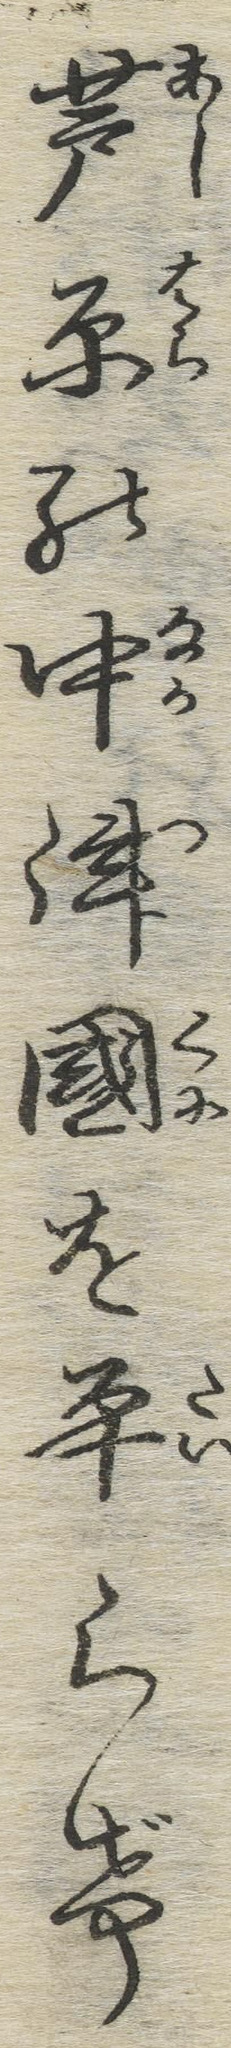芦原の中津国を平らげ

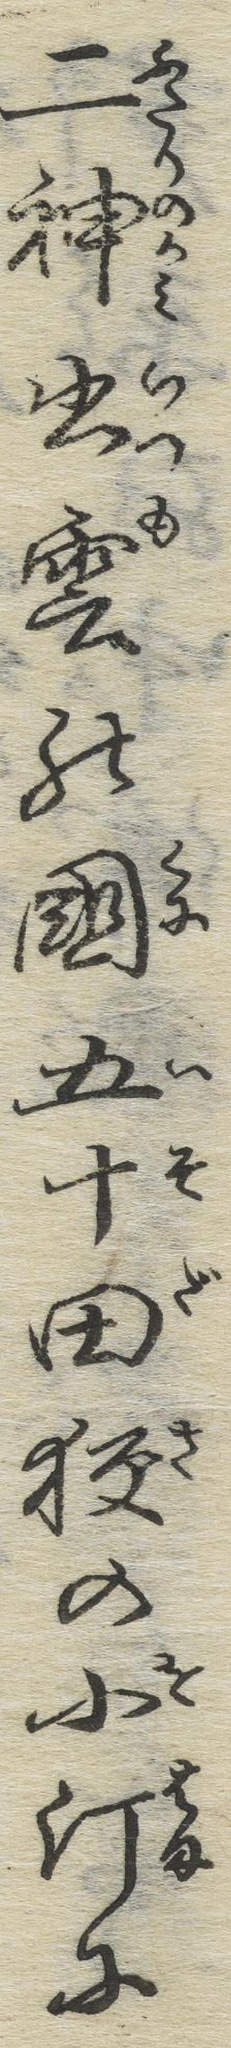二神出雲の国五十田狭の小汀に
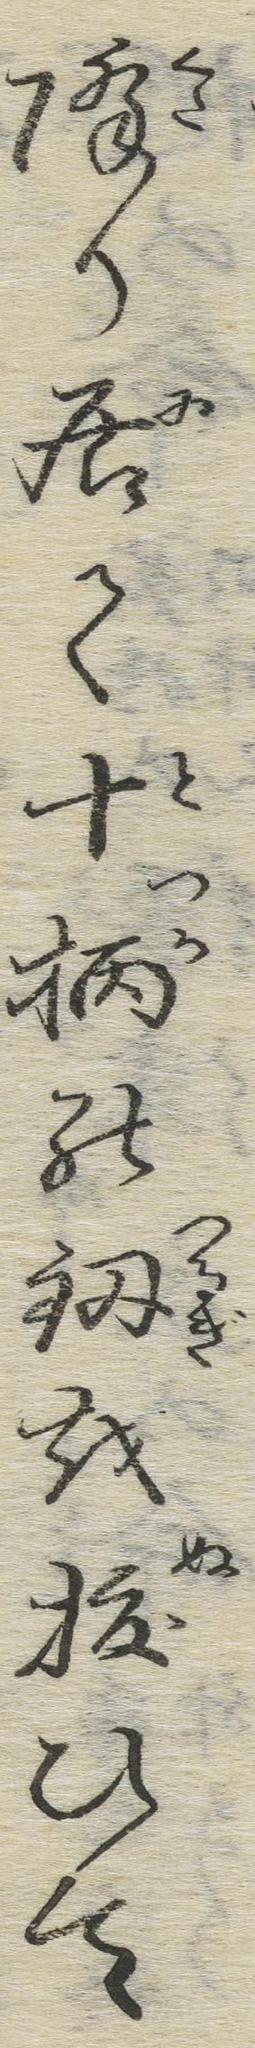降り居て十柄の剱を抜ひて
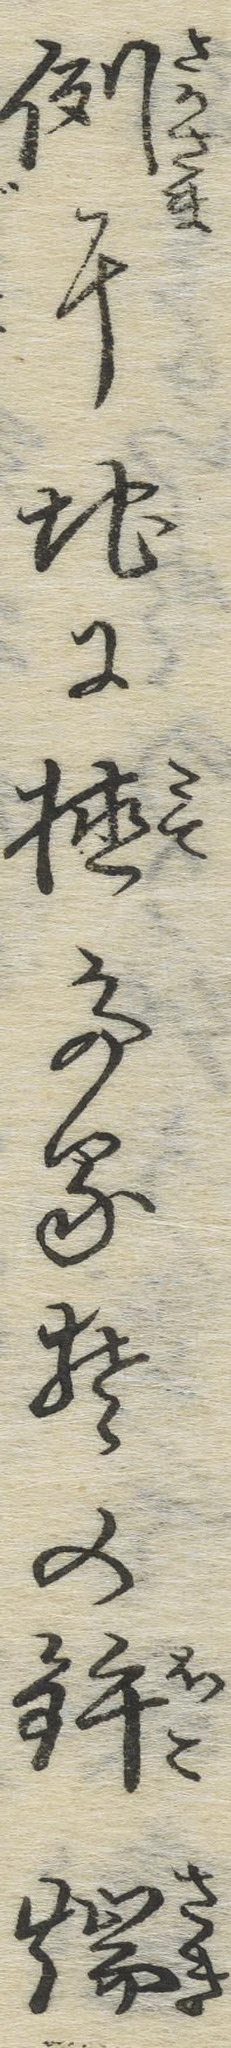倒に地に立たるその鉾端
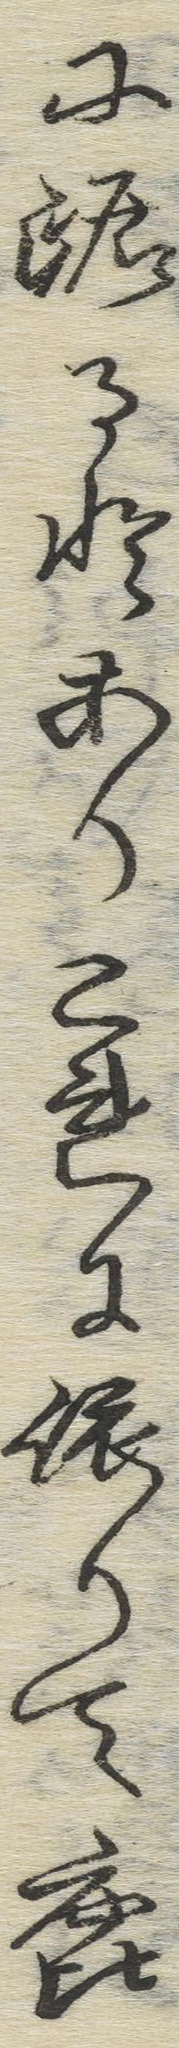に踞るとありこれに依りて鹿
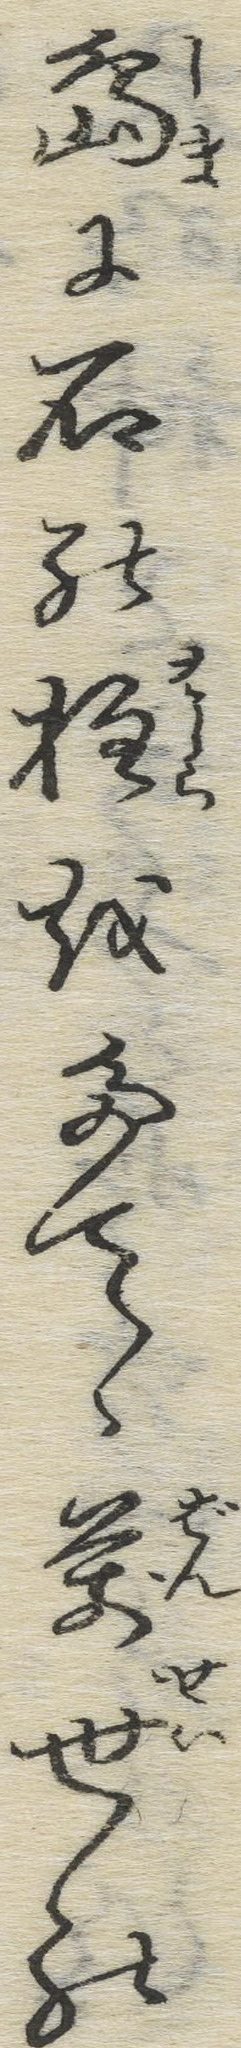島に石の柱をたてゝ万世の
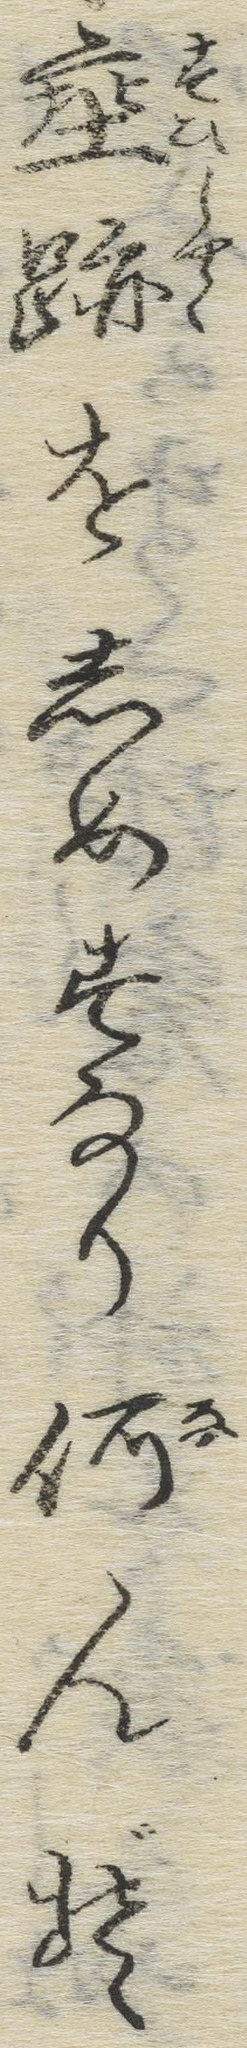垂跡をしめすなり何んぞ
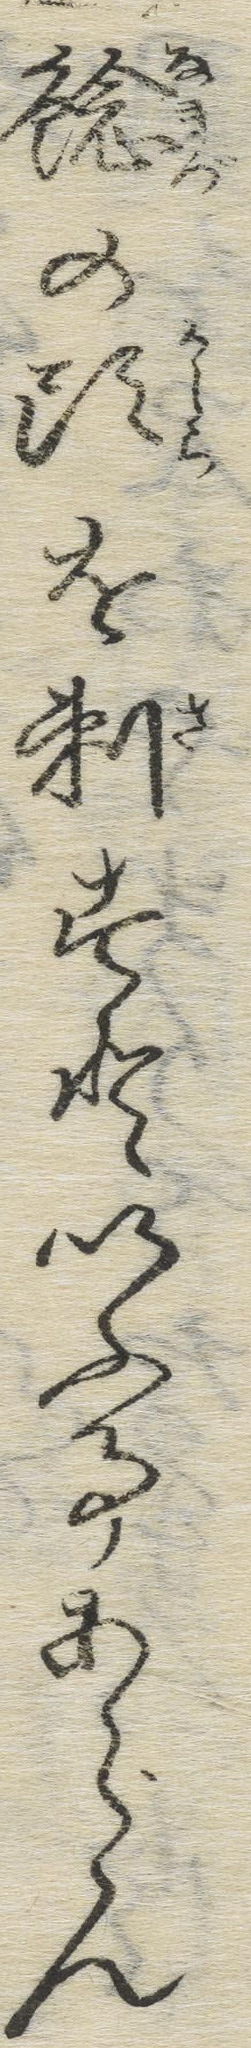鯰の頭を刺すといふ事あらん
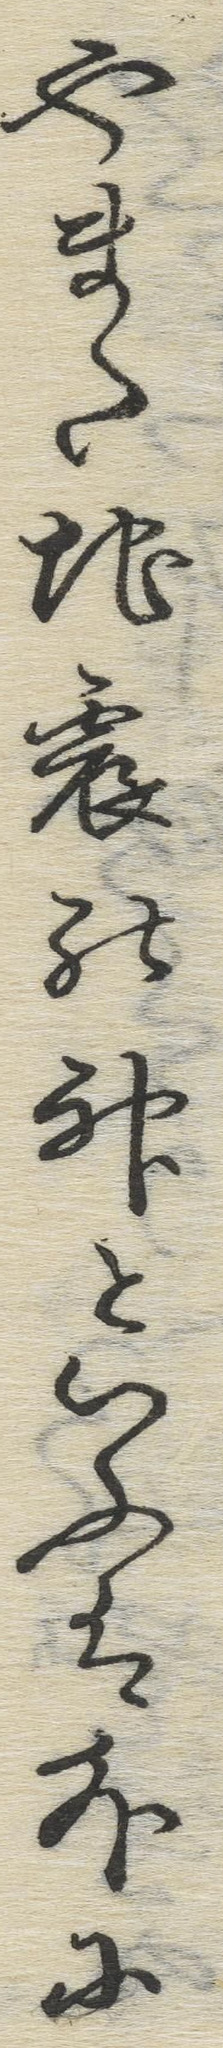やまた地震の神といふは外に
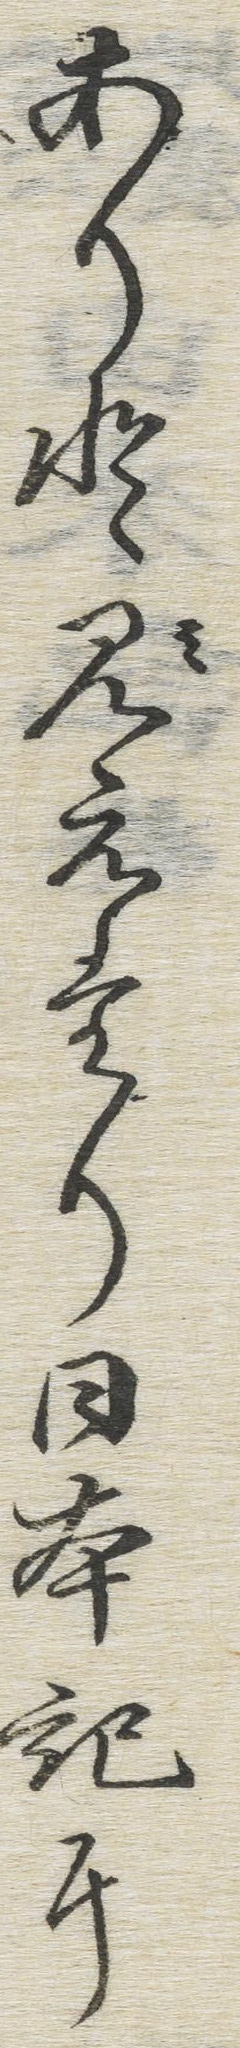ありと見えたり日本記に
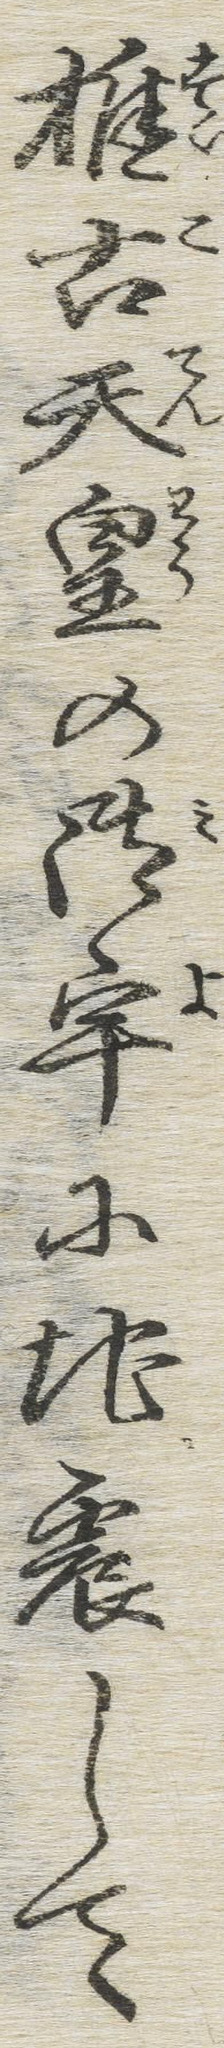推古天皇の御宇に地震して
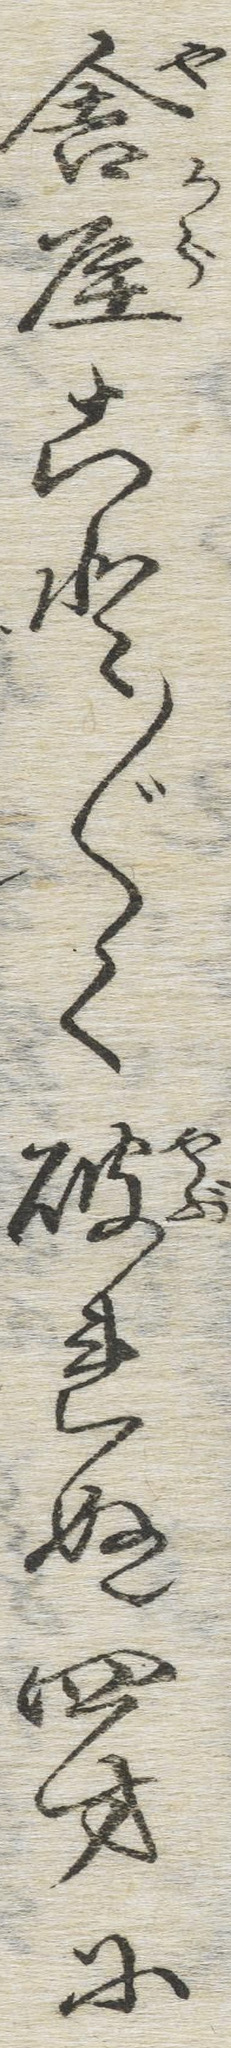舎屋こと〴〵く破れぬ四方に
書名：雷公地震由來記　全
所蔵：東京大学地震研究所図書室 Earthquake Research Institute Library, The University of Tokyo, JAPAN
